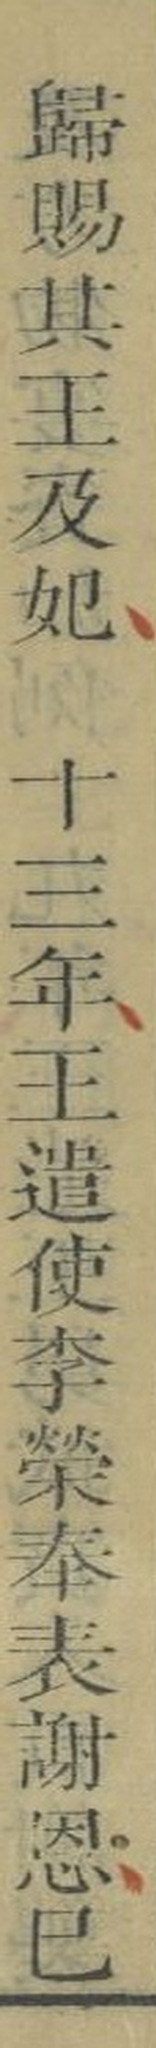帰賜其王及妃十三年王遣使李栄奉表謝恩巳
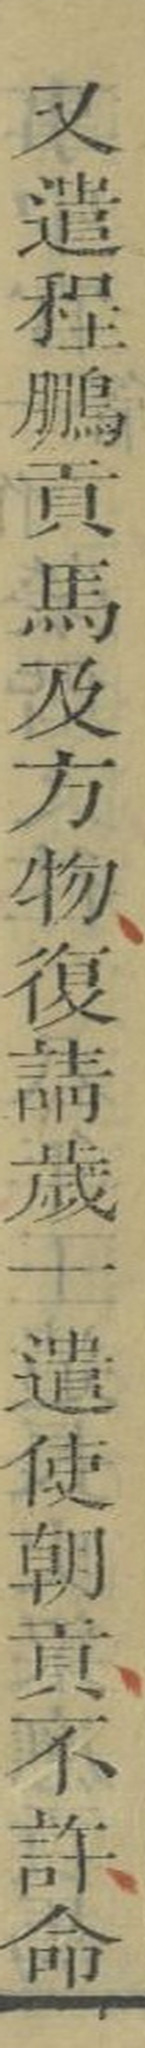又遣程鵬貢馬及方物復請歳一遣使朝貢不許命
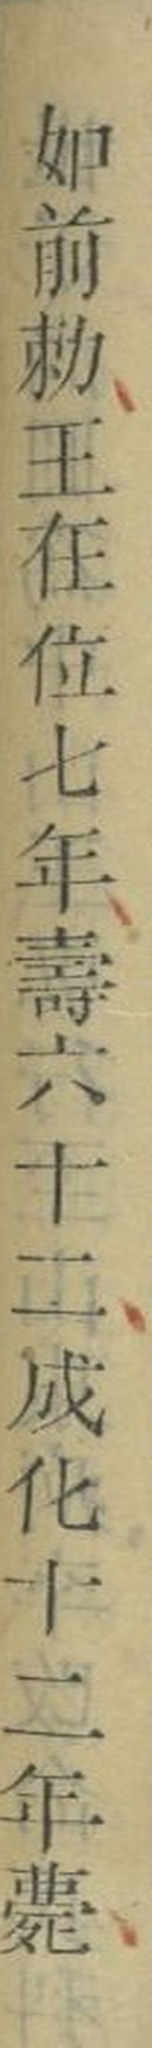如前勅王在位七年寿六十二成化十二年薨
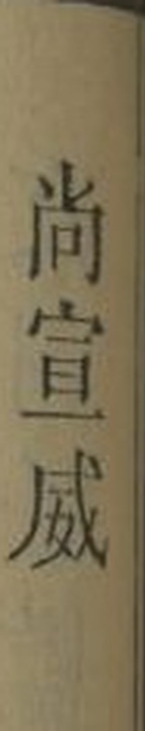尚宣威
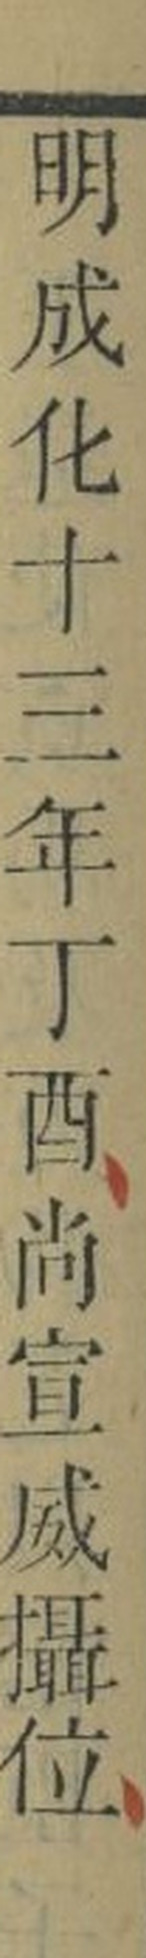明成化十三年丁酉尚宣威摂位
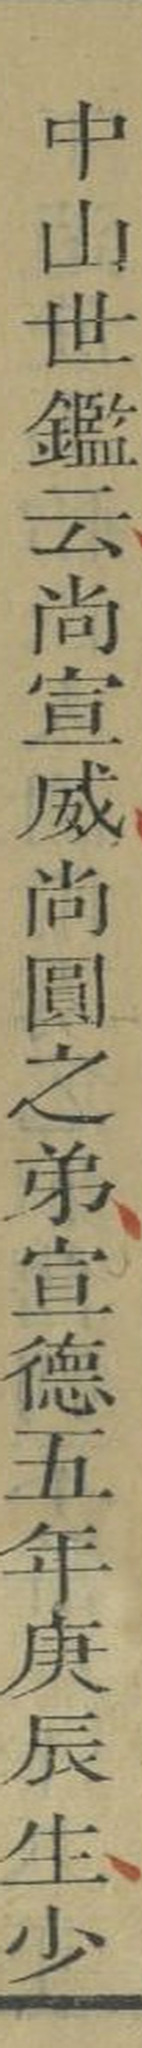中山世鑑云尚宣威尚円之弟宣徳五年庚辰生少
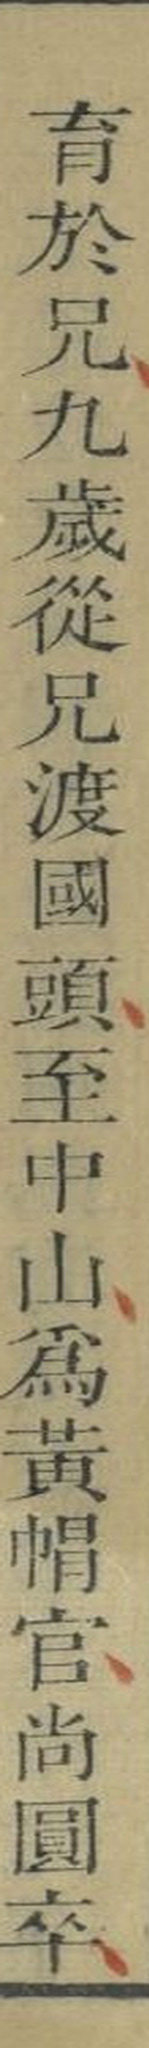育於兄九歳従兄渡国頭至中山為黄帽官尚円卒
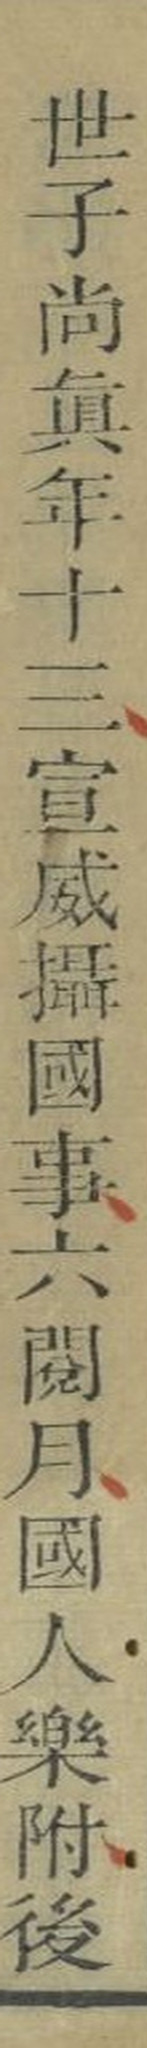世子尚真年十三宣威摂国事六閲月国人楽附後
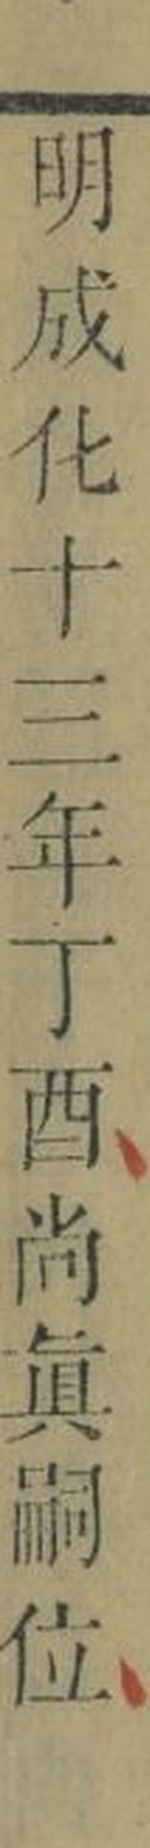明成化十三年丁酉尚真嗣位

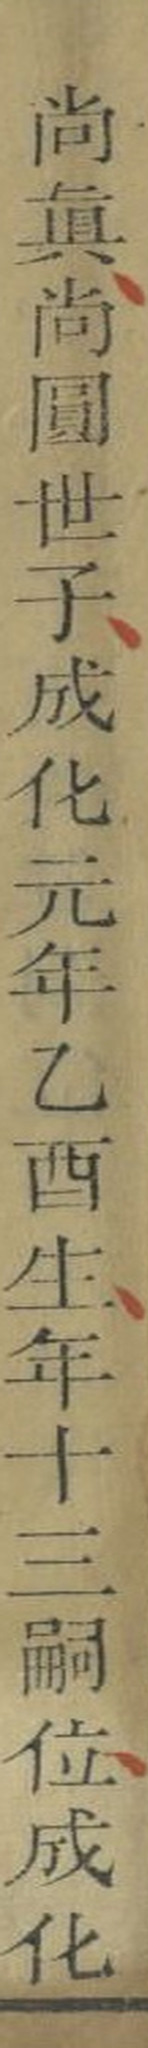尚真尚円世子成化元年乙酉生年十三嗣位成化
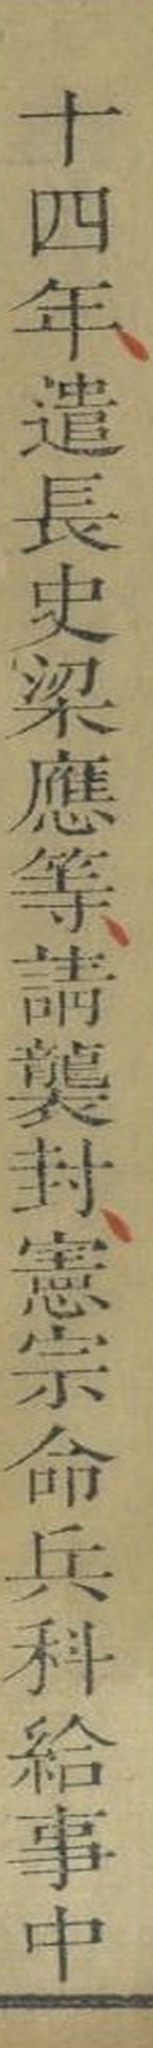十四年遣長史梁応等請襲封憲宗命兵科給事中
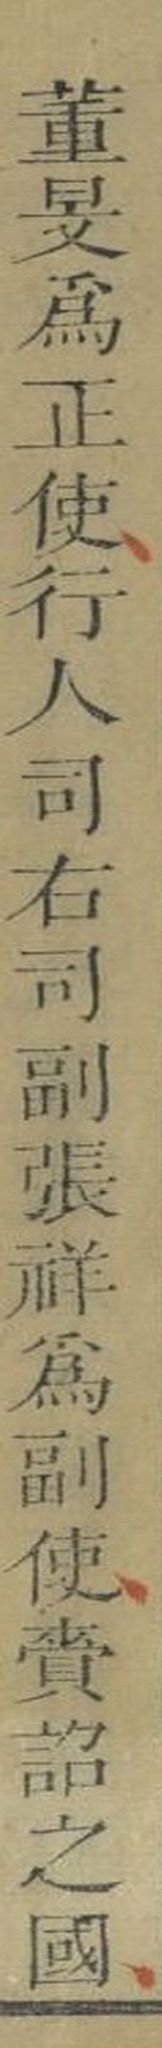董旻為正使行人司右司副張祥為副使賚詔之国
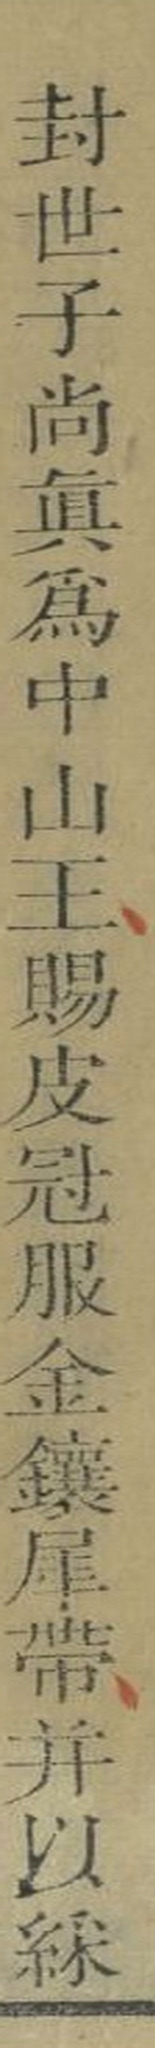封世子尚真為中山王賜皮冠服金鑲犀帯并以綵
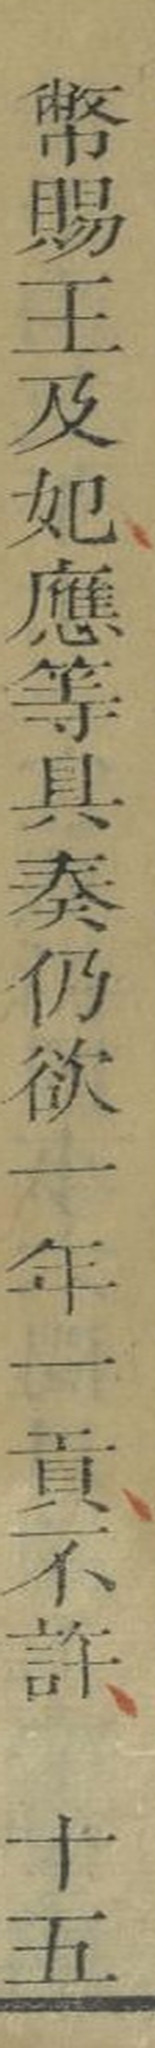幣賜王及妃応等具奏仍欲一年一貢不許十五
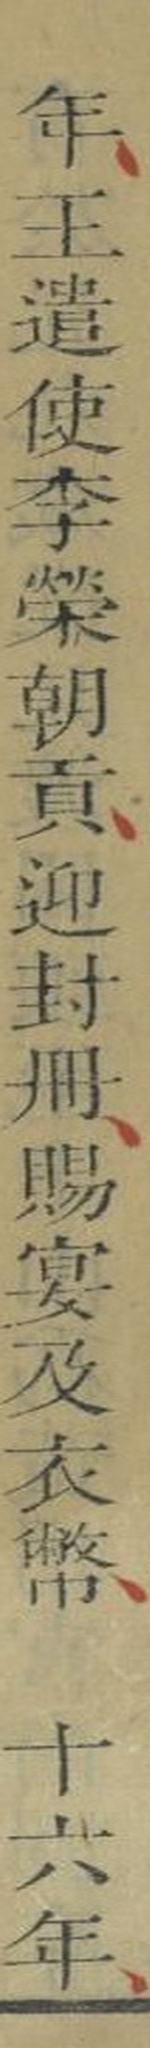年王遣使李栄朝貢迎封冊賜宴及衣幣十六年
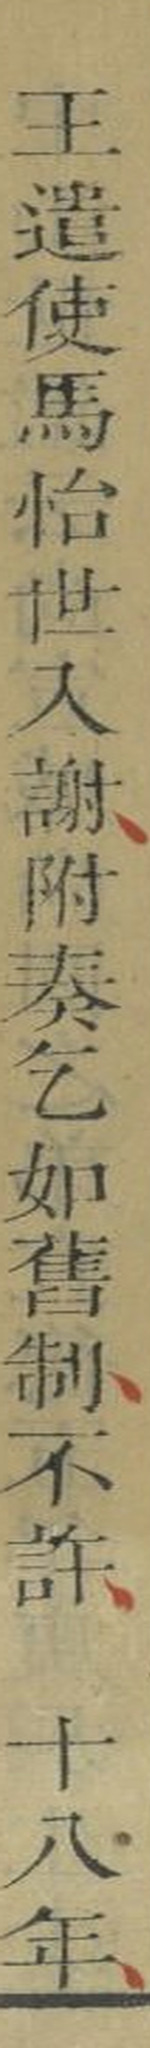王遣使馬怡世入謝附奏乞如旧制不許十八年
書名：中山伝信録 巻三
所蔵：University of the Ryukyus Library
